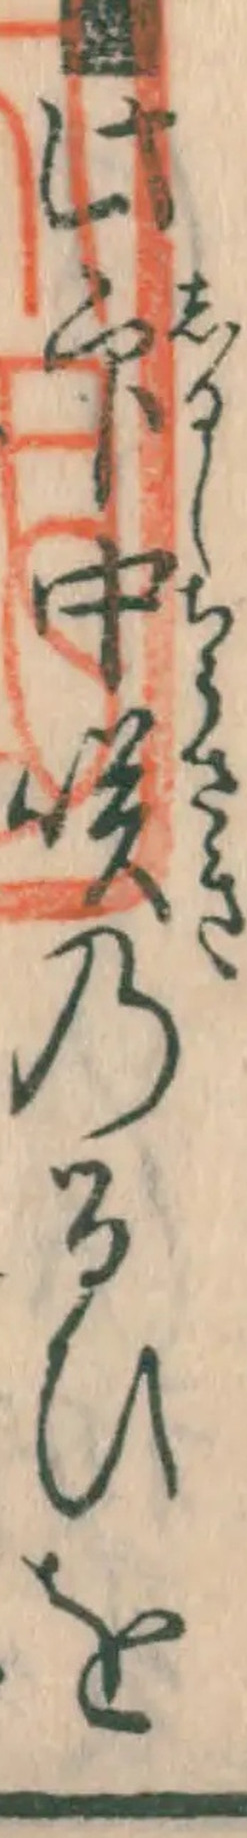此印中咲のるひを
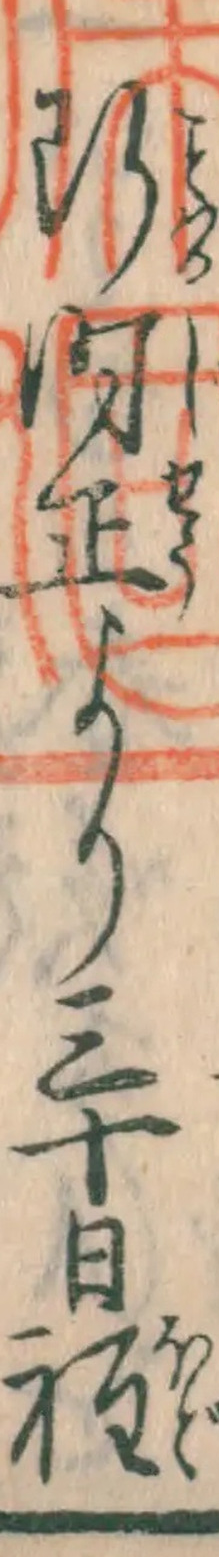断時正より三十日程
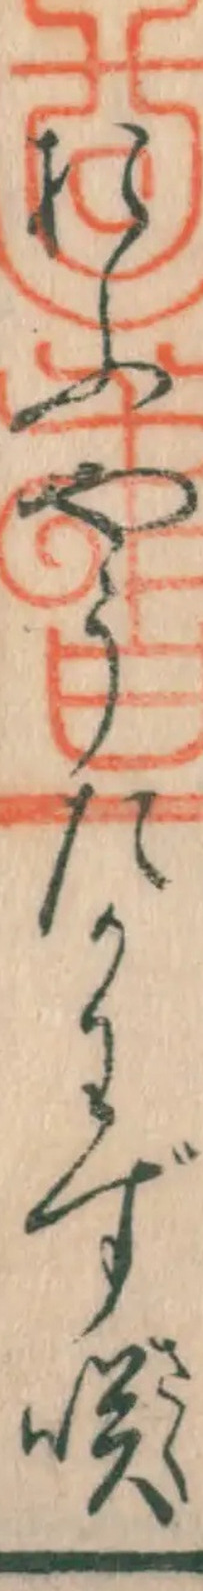おふやうたかわず咲
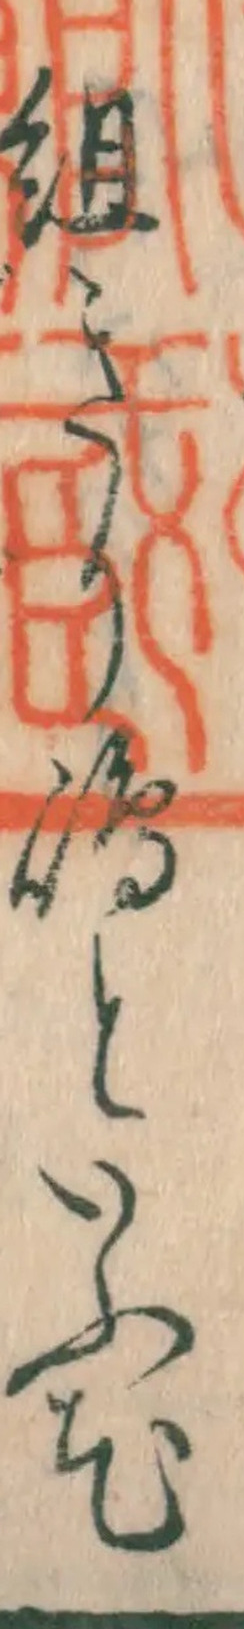組きり嶋といふ花
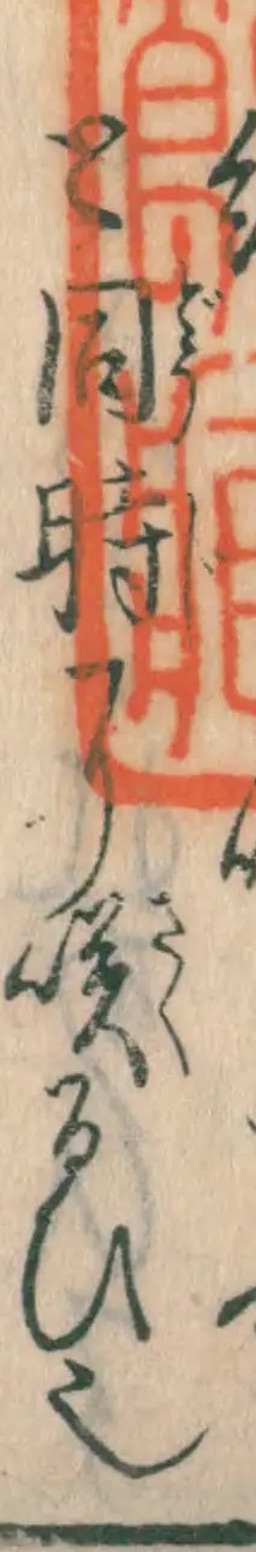と同時に咲るひ也
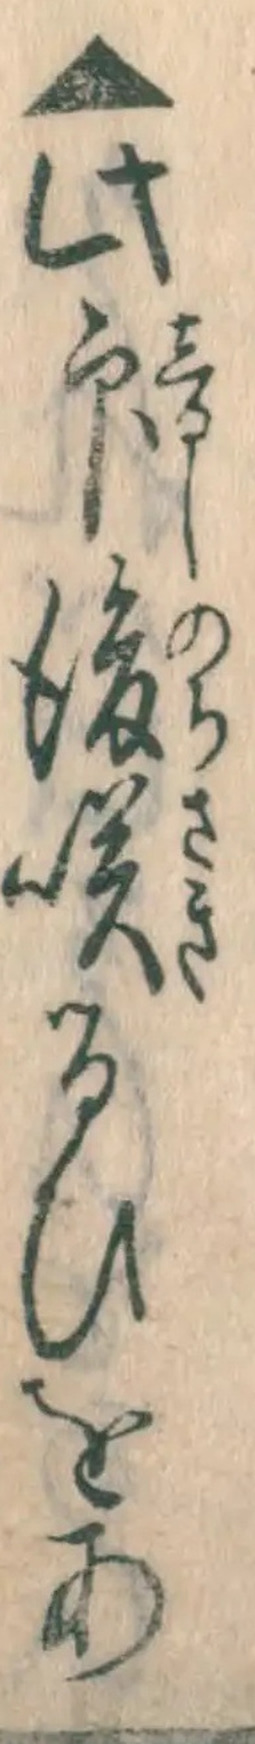▲此印後咲るひをあ
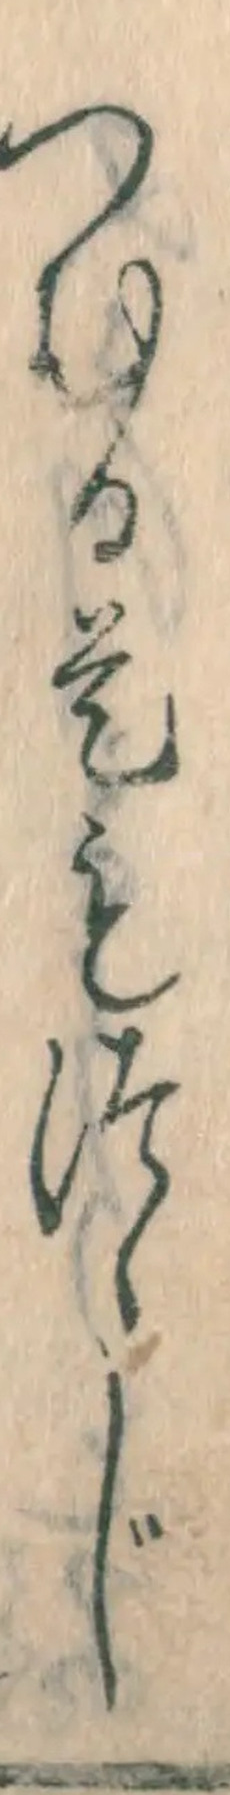つむる是をつゝじ

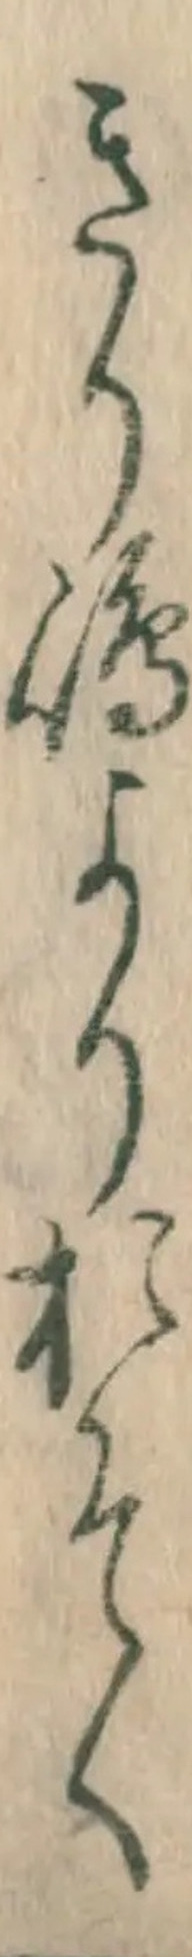きり嶋よりおそく
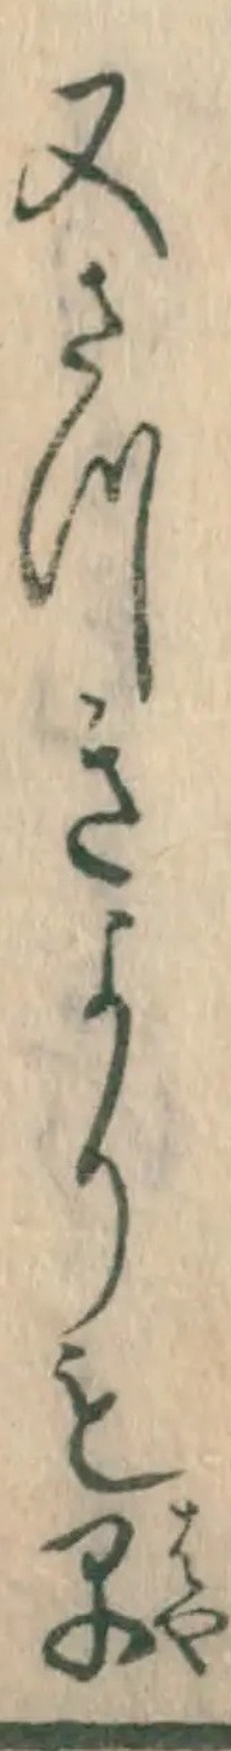又さつきよりも早
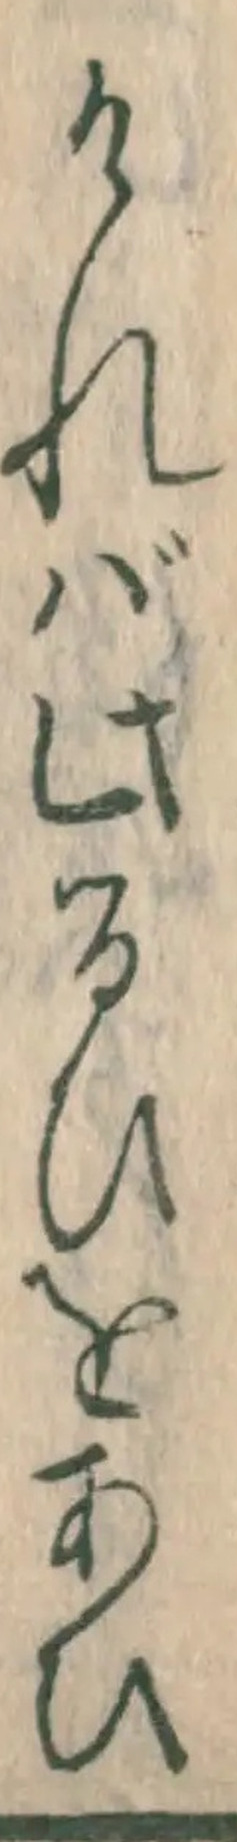ければ此るひをあひ
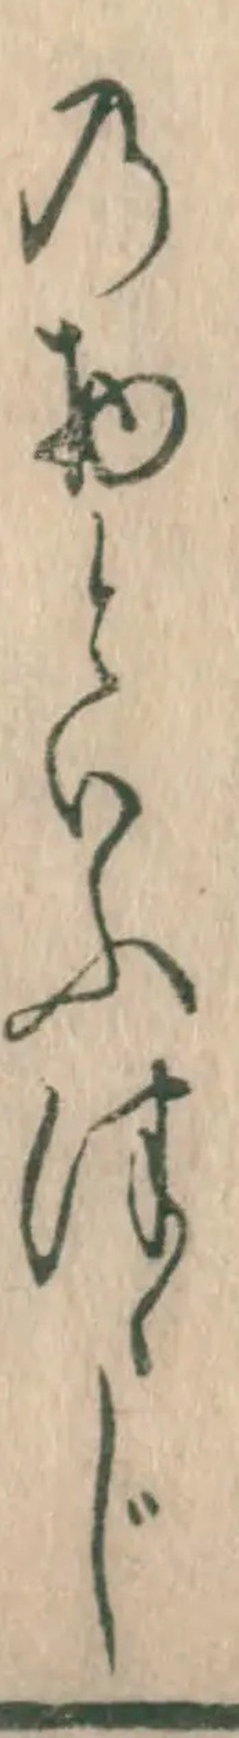の物といふつゝじ
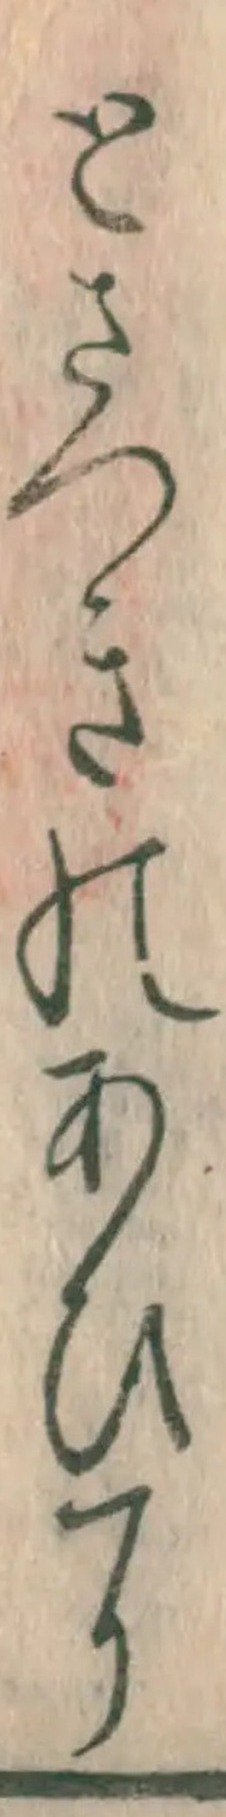とさつきのあひに
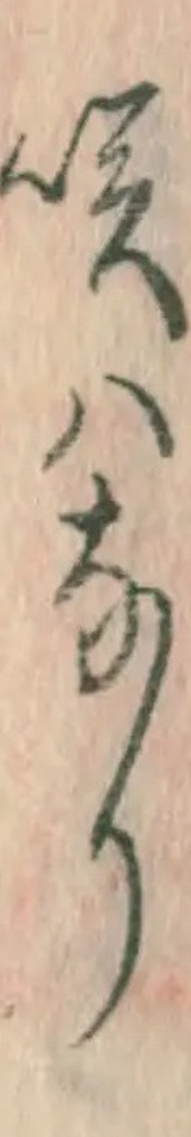咲はなり
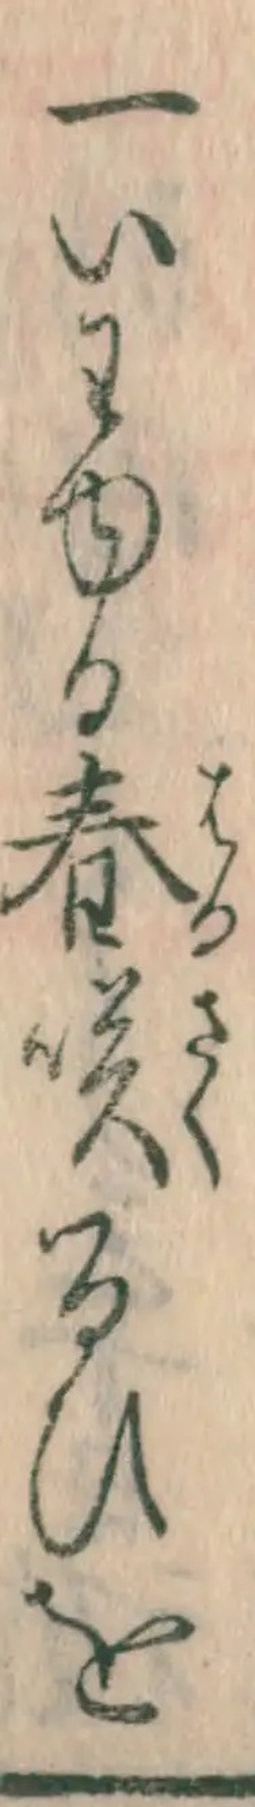一いわゆる春咲るひを
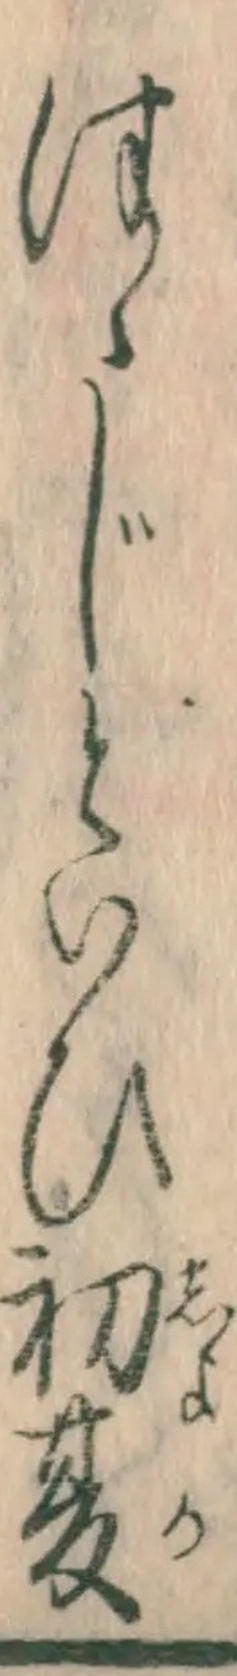つゝじといひ初夏
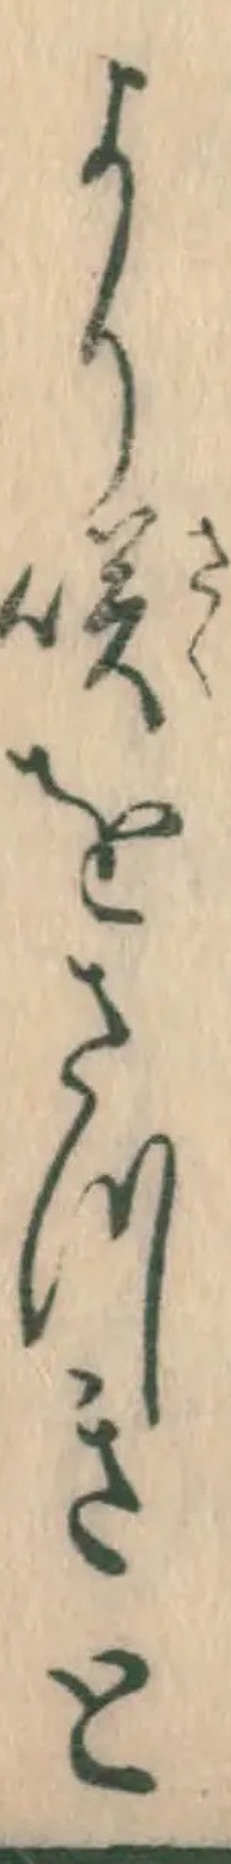より咲をさつきと
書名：錦繍枕 5巻. [1]
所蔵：国立国会図書館 National Diet Library, JAPAN
